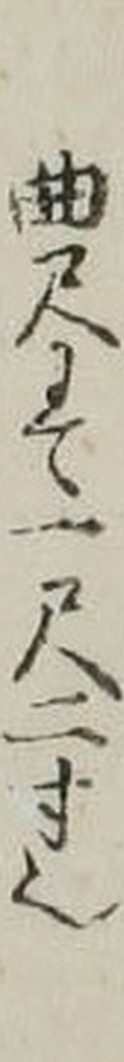曲尺にて一尺二寸也
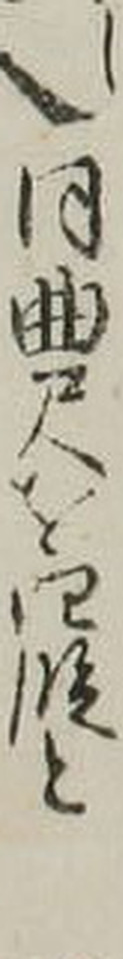鯨尺同曲尺を四段と
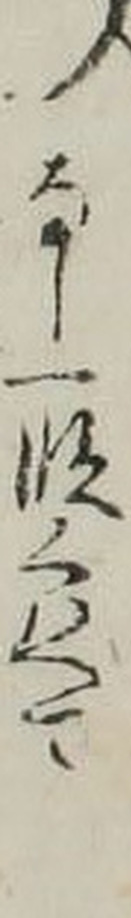なし一段くはへて
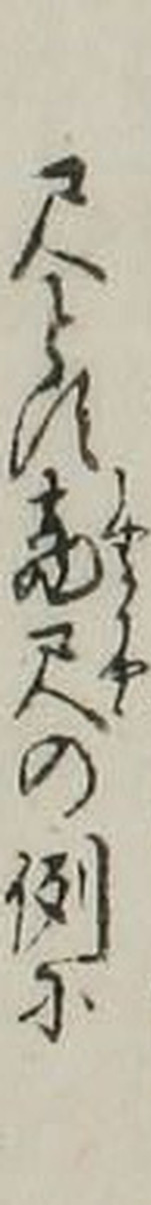尺とす商尺の例に
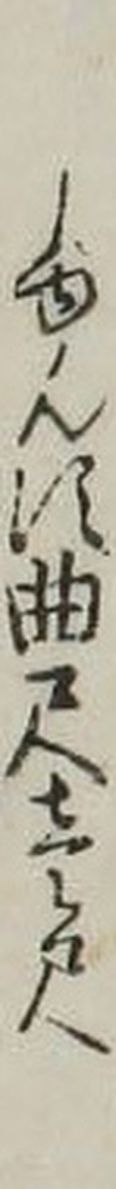しゆんす曲尺壱尺
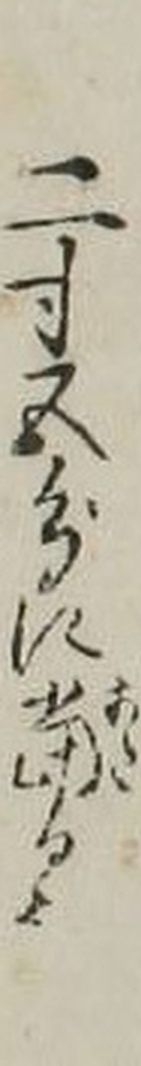二寸五分に当る也
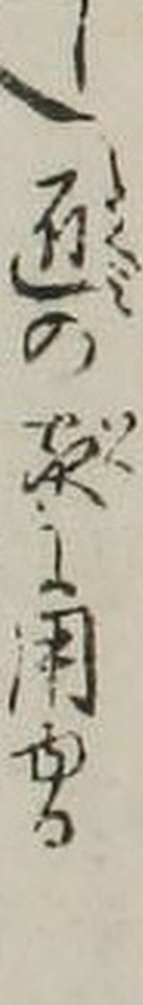曲尺匠の家に用ゆる
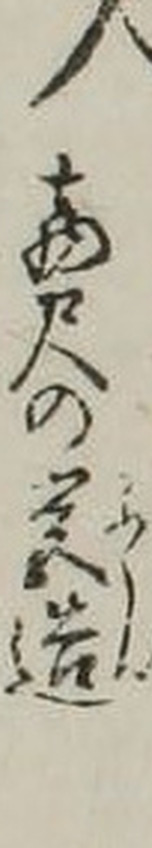商尺の宮造
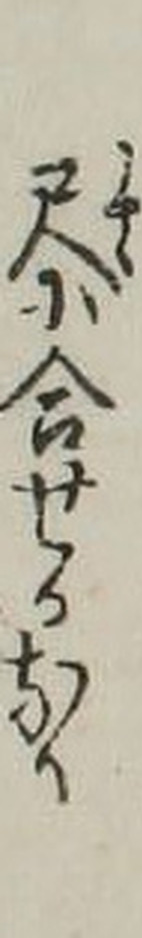尺に合せるなり
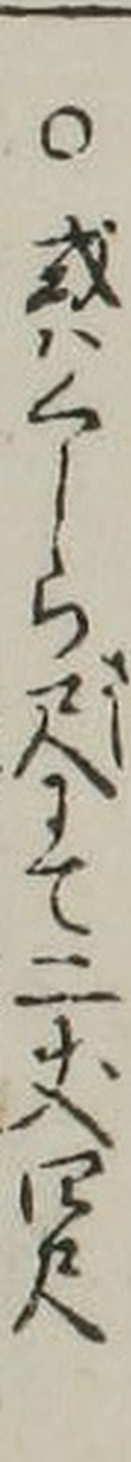○或はくしら尺にて二丈四尺
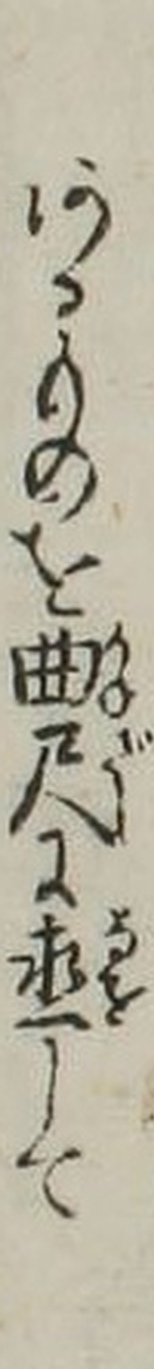あるものを曲尺に直して
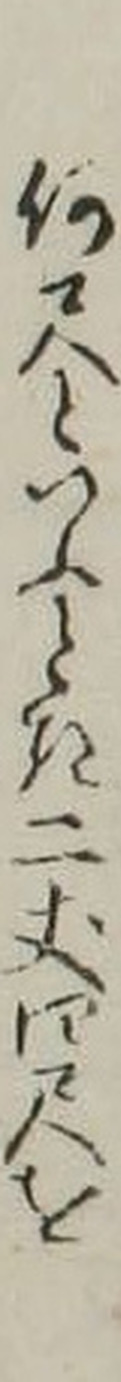何尺といふとき二丈四尺を
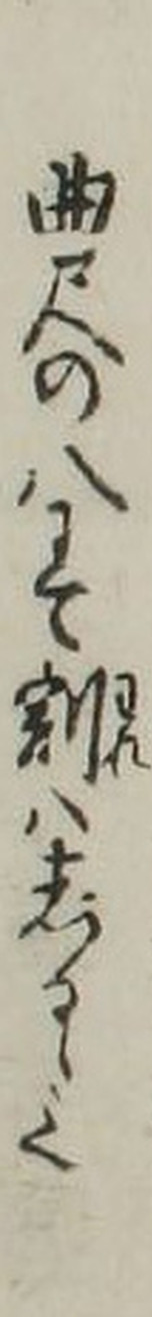曲尺の八にて割はしるゝ也

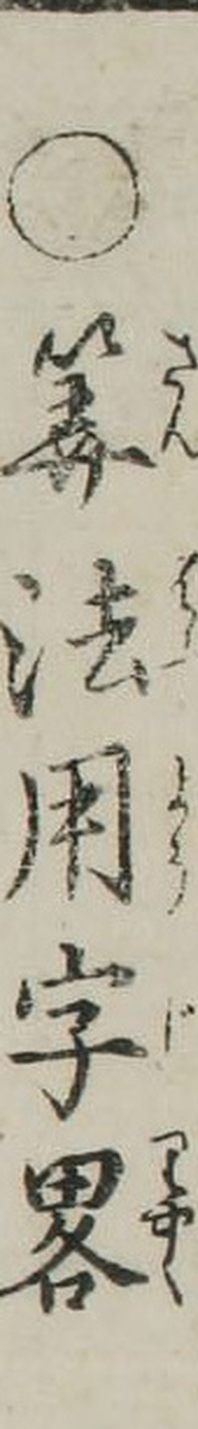○算法用事略
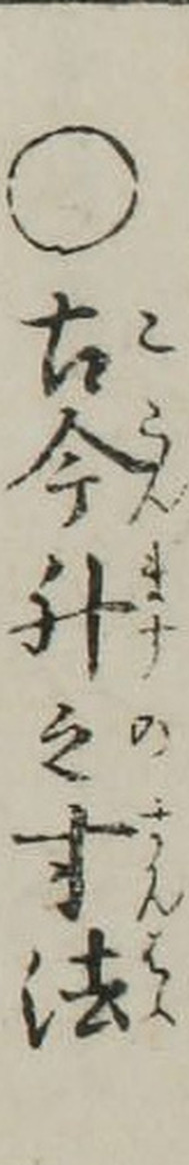○古今升之寸法
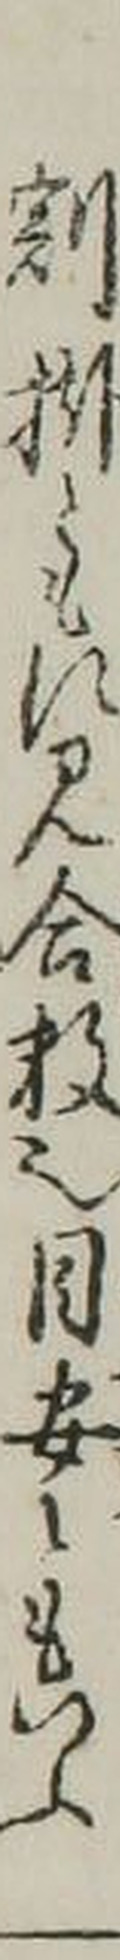法割掛ともに見合数也目安ともいふ
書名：宝玉塵劫記
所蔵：東京学芸大学教育コンテンツアーカイブ
